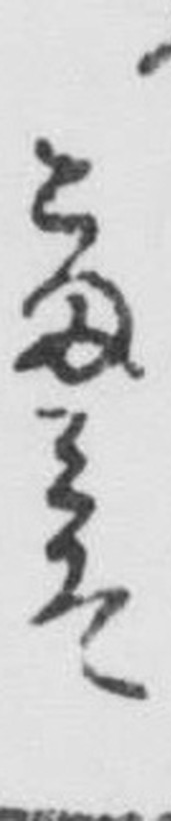こまみそ
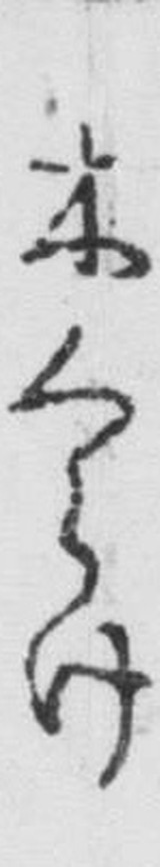木くらけ
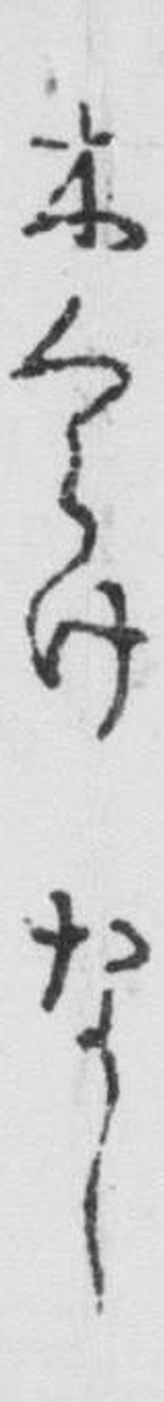木くらけなし
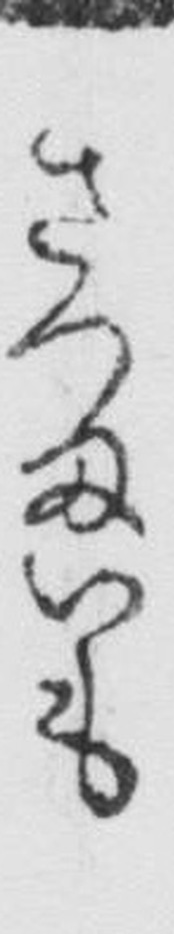さつまいも
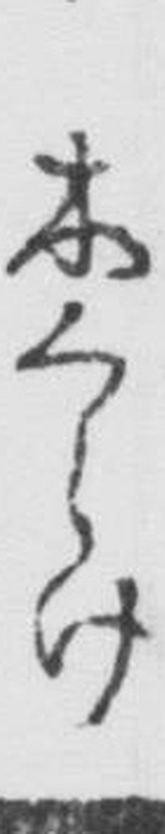木くらけ
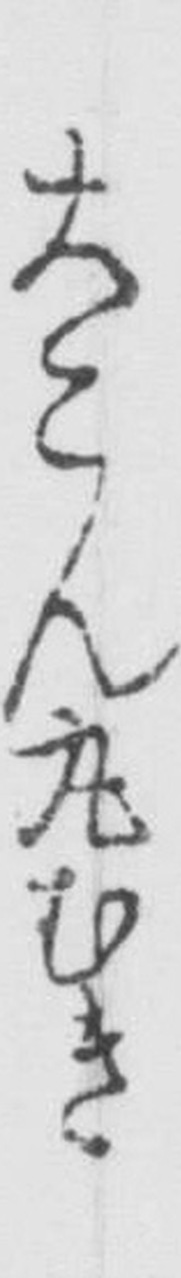大こん丸むき
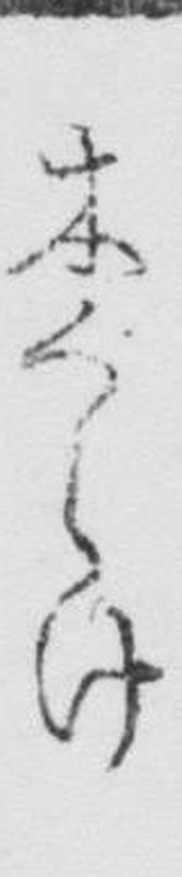木くらけ
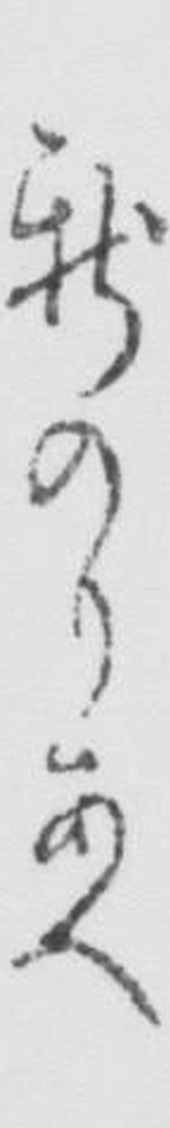新のりあへ
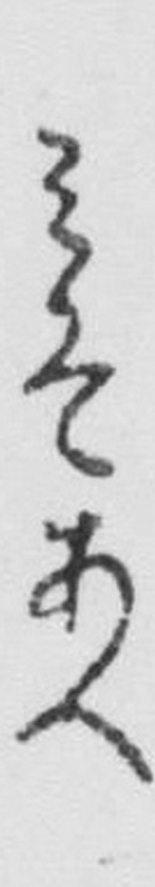みそあへ
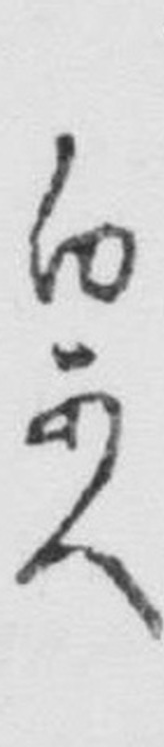白あへ
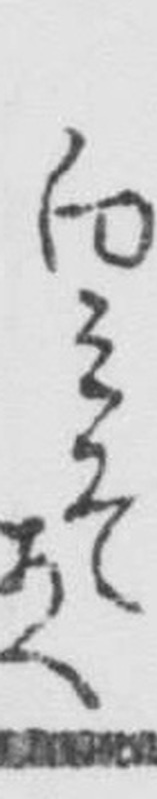白みそあへ
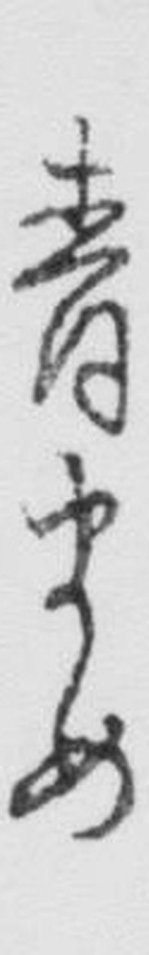青まめ
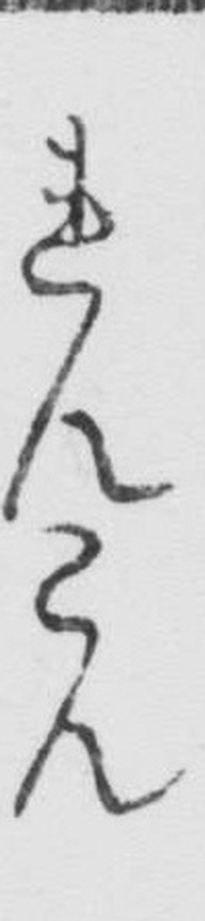れんこん
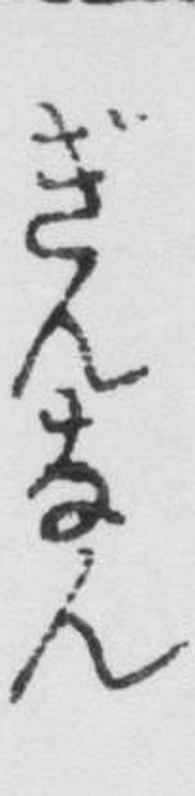ぎんなん
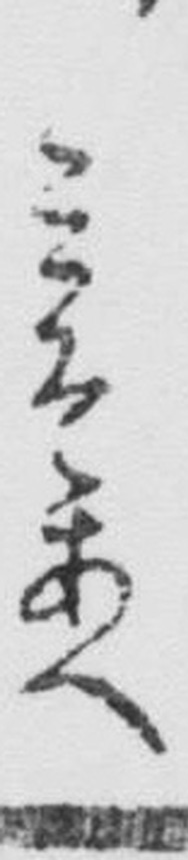みそあへ
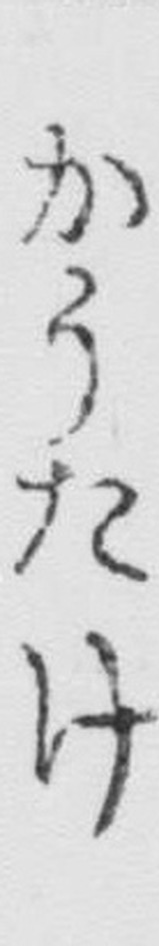かうたけ
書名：諸家通用/即席料理
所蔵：大阪府立大学学術情報センター 国文学研究資料館
